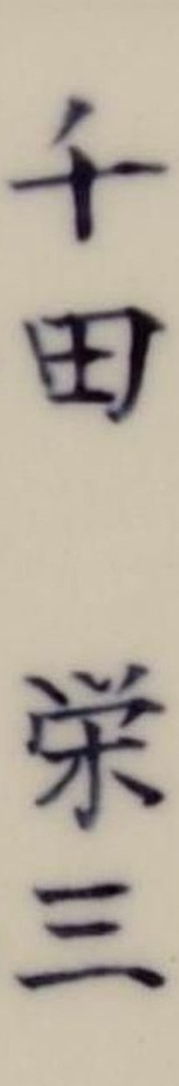千田栄三
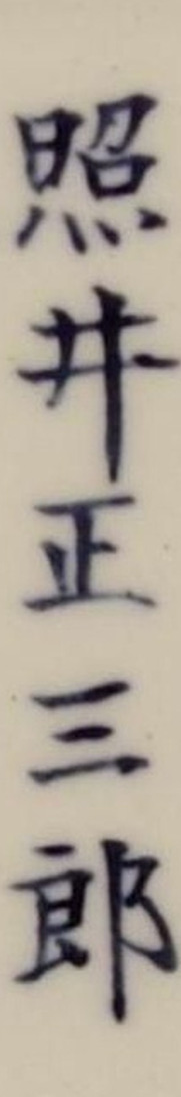照井正三郎
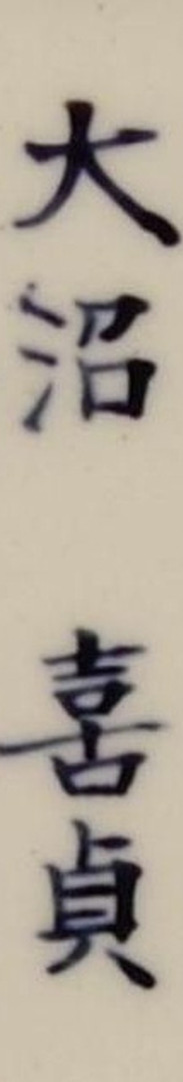大沼喜貞
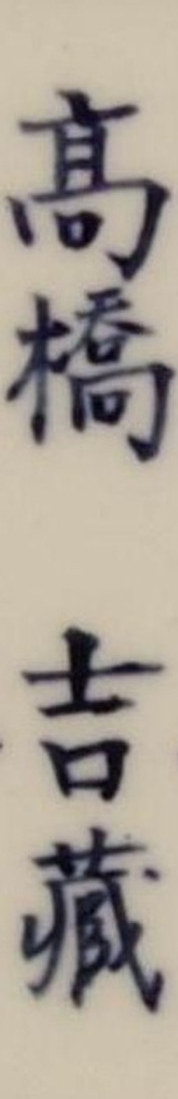高橋吉蔵
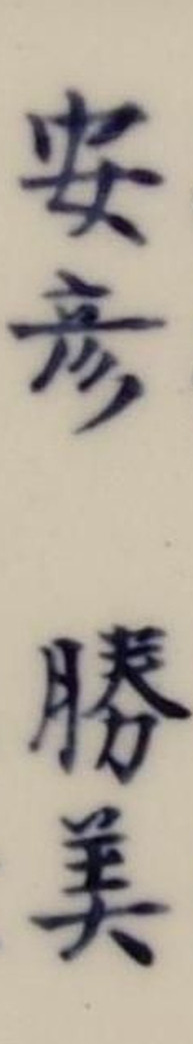安彦勝美
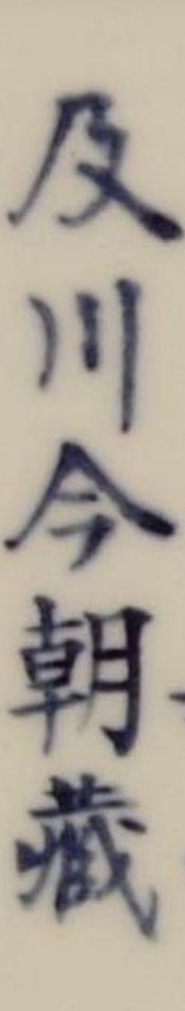及川今朝蔵
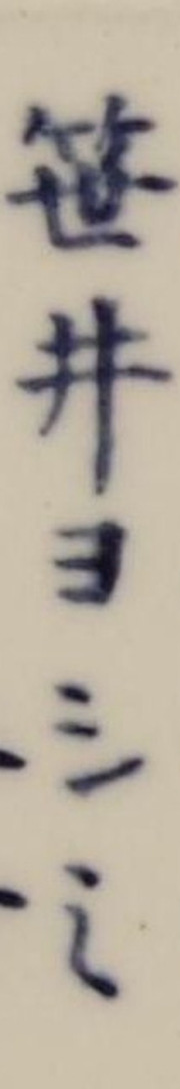笹井ヨシミ
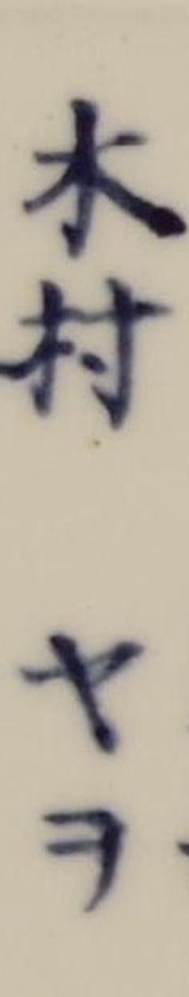木村ヤヲ
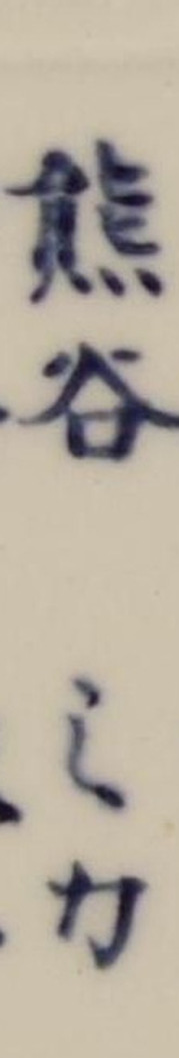熊谷ミ力
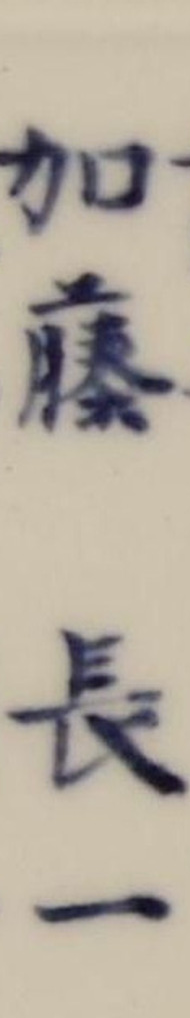加藤長一
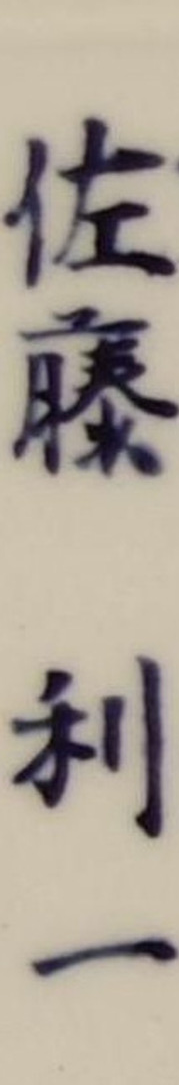佐藤利一

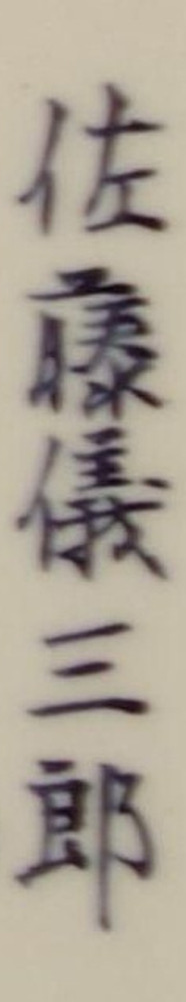佐藤儀三郎
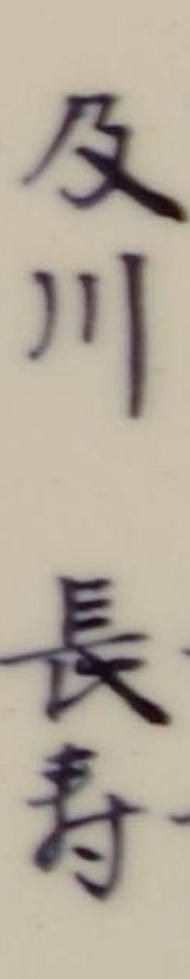及川長寿
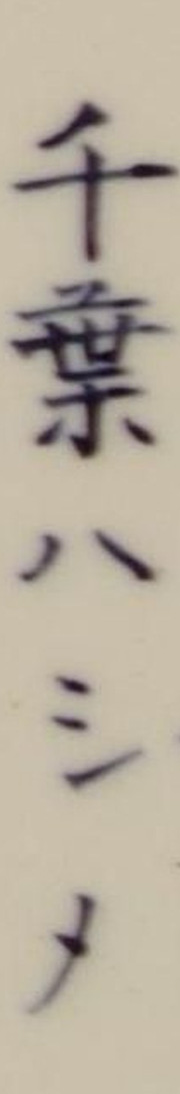千葉ハシメ
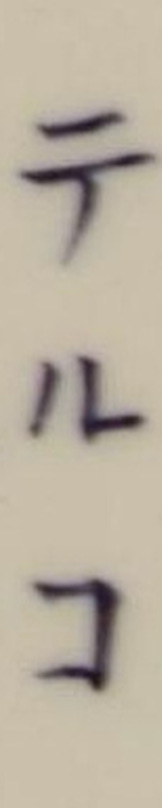テルコ
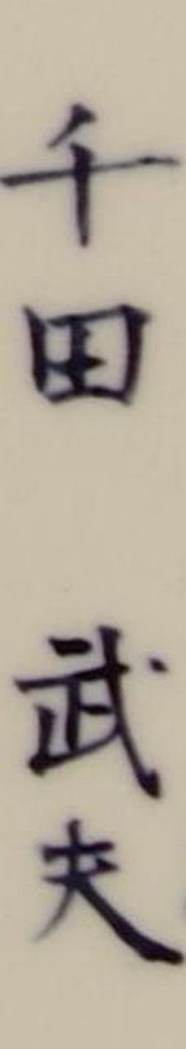千田武夫
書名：E~L
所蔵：高野山金剛峯寺
